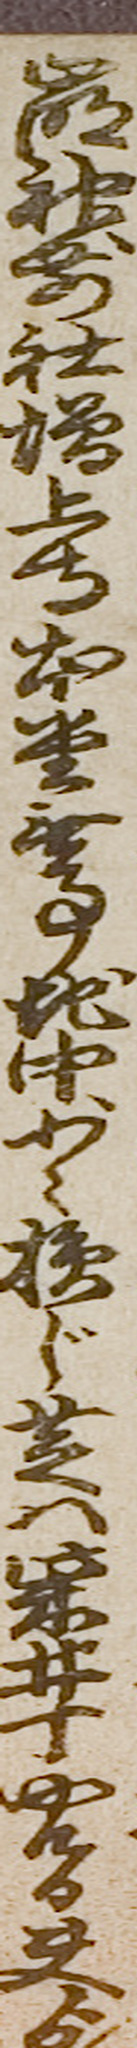崩神前社増上寺本堂無事地中少々損じ芝は柴井丁やける夫ゟ
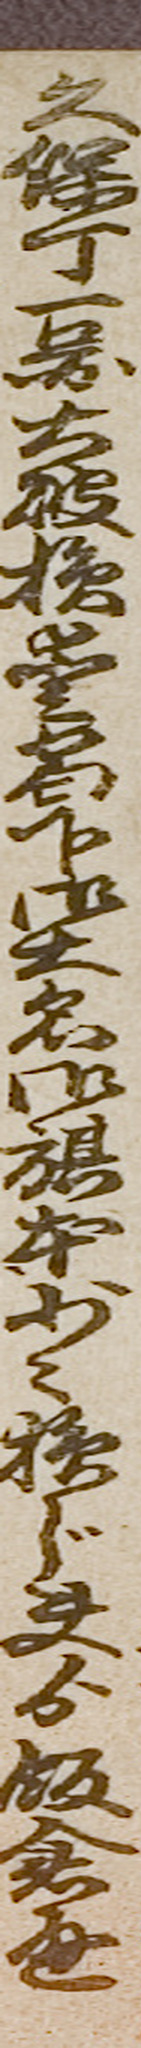久保丁一円大破損愛宕下御大名御旗本少々損じ夫ゟ飯倉通
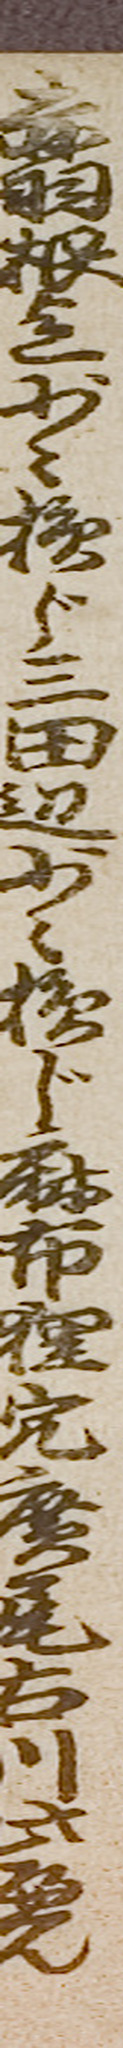赤羽根迄少々損じ三田辺少々損じ麻布狸穴広尾古川此へん
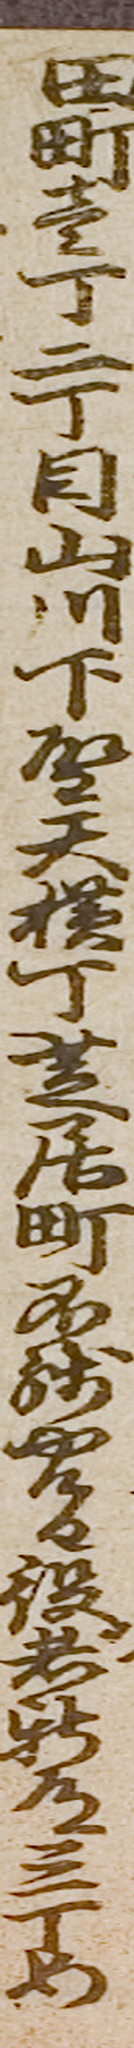田町壱丁二丁目山川下聖天横丁芝居町不残やける役者新道三丁め
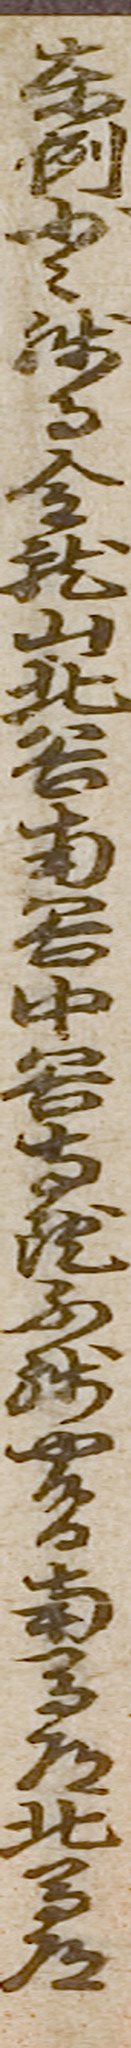東側少々残る金龍山北谷南谷中谷寺院不残やける南馬道北馬道
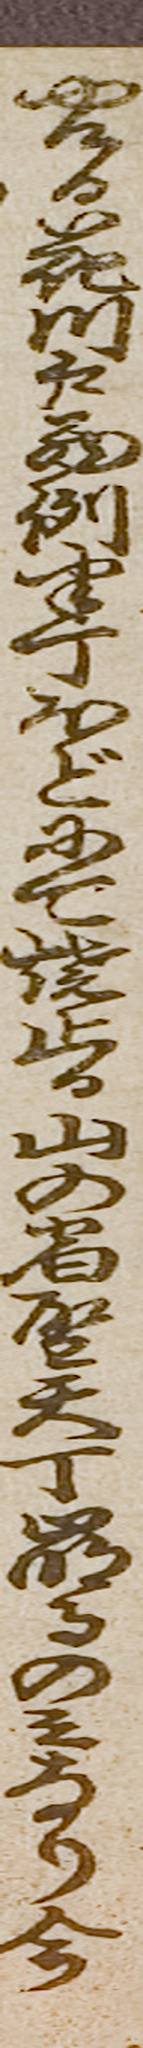やける花川戸西側半丁ほどにて焼止る山の宿聖天丁崩るのみなり今
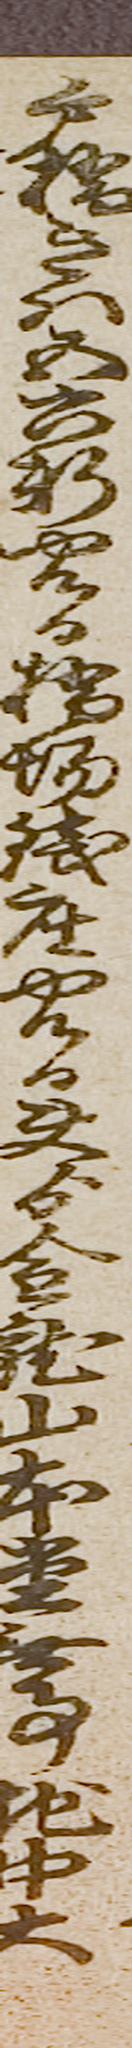戸橋きは五六軒やける橋場銭座やける夫ゟ金龍山本堂無事地中大
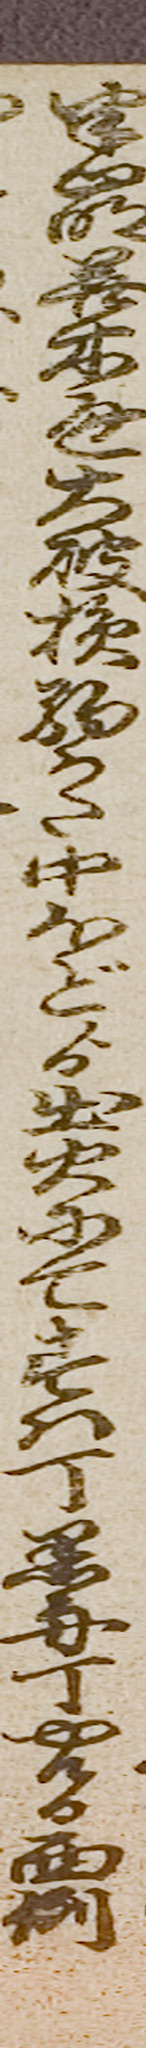半崩並木通大破損駒かた中ほどゟ出火にてすは丁黒舟丁やける西側
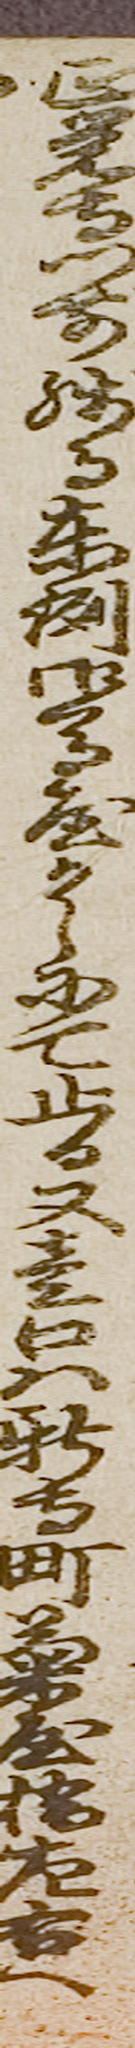正覚寺門前残る東側御馬屋かしにて止る又壱口は新寺町菊屋橋左右へ
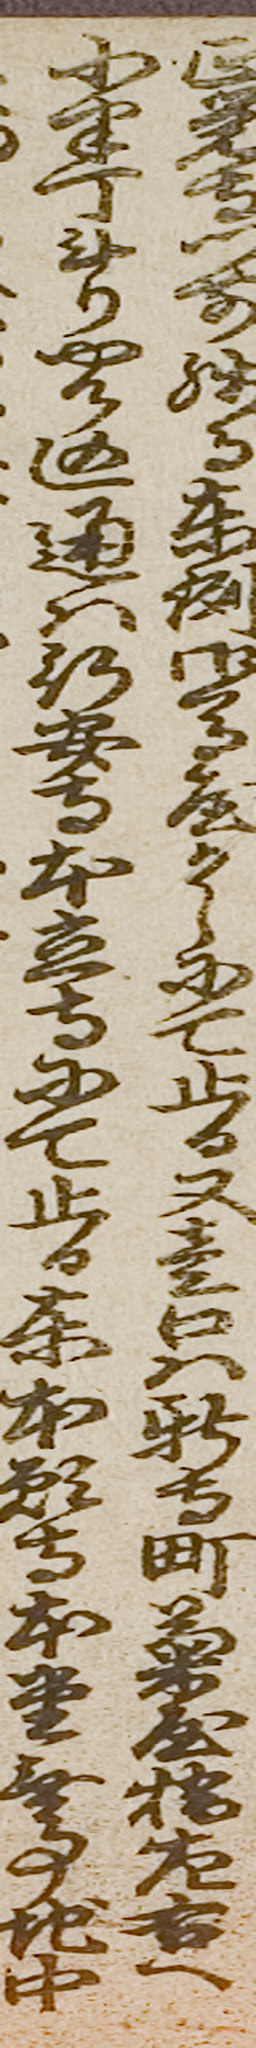小半丁斗りやけ込通は行安寺本立寺にて止る東本願寺本堂無事地中
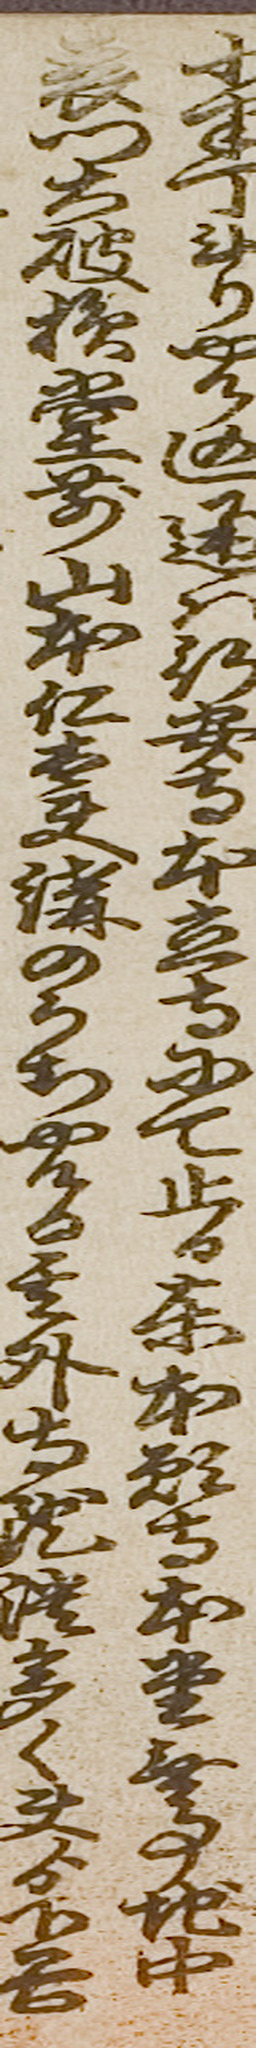表門大破損堂前山本仁太夫溝のうちやける其外寺院潰多く夫ゟ下谷
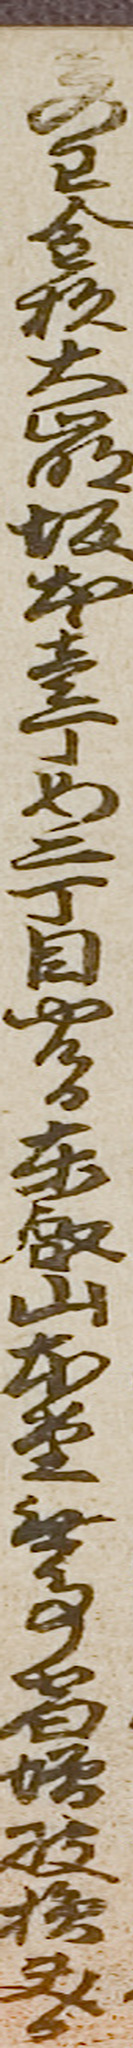三のわ金杉大崩坂本壱丁め二丁目やける東叡山本堂無事宿坊破損夫ゟ
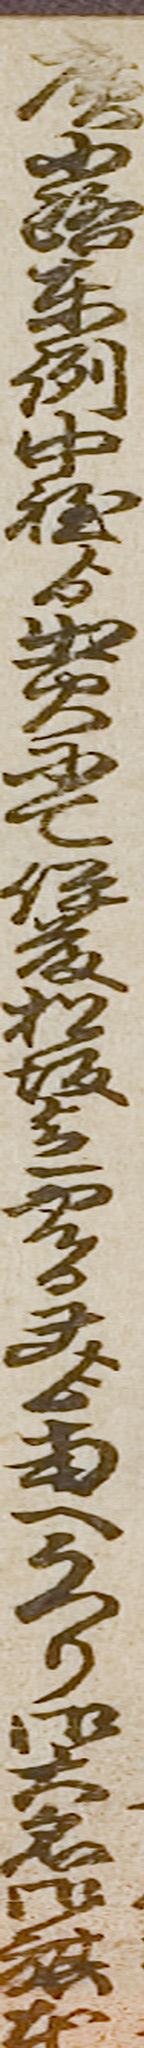広小路東側中程ゟ出火にて伊藤松坂迄やける夫ゟ南へうつり御大名御旗本
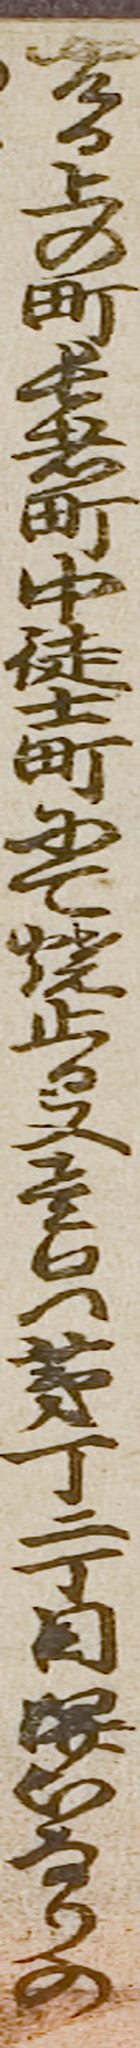やける上の町長者町中徒士町にて焼止る又壱口は茅丁二丁目堺いなりの
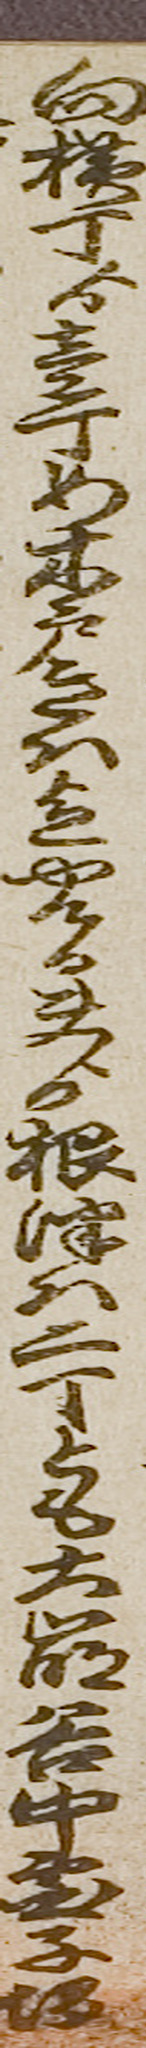向横丁ゟ壱丁め木戸きは迄やける夫ゟ根津は二丁とも大崩谷中団子坂
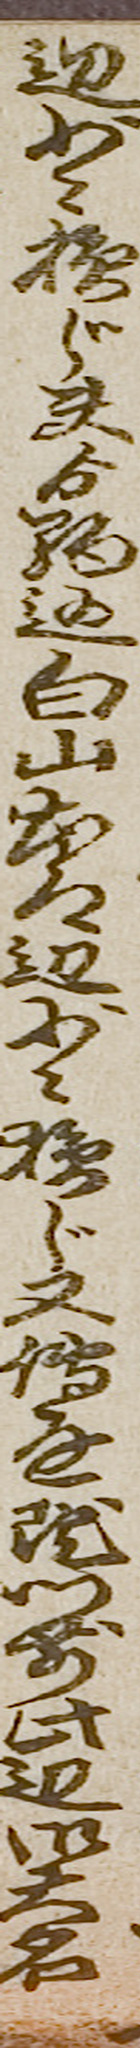辺少々損じ夫ゟ駒込白山本郷辺少々損じ又伝通院門前此辺御大名
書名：[安政地震状況図]
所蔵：東京大学総合図書館 General Library in the University of Tokyo, JAPAN
